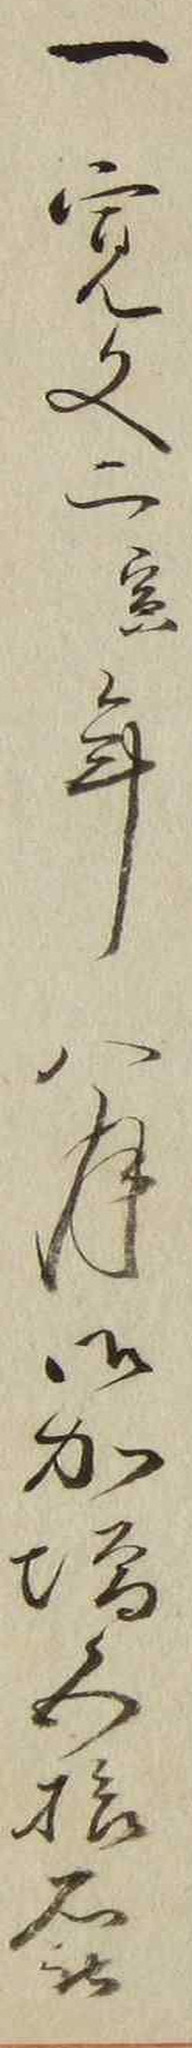一寛文二寅年八月御加増五拾石被

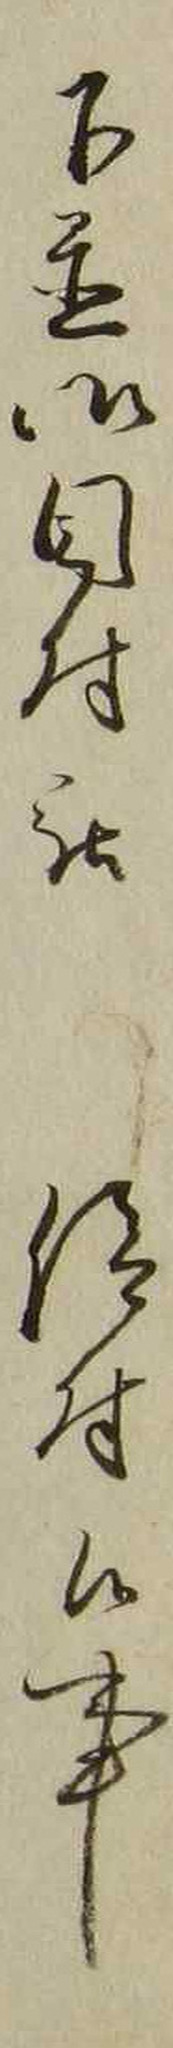下置御目付被仰付候事
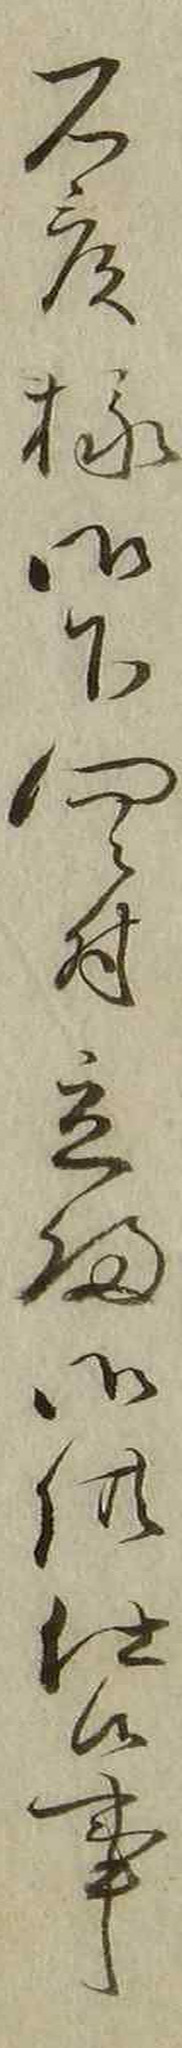石彦様御下向ニ付立帰御供仕候事
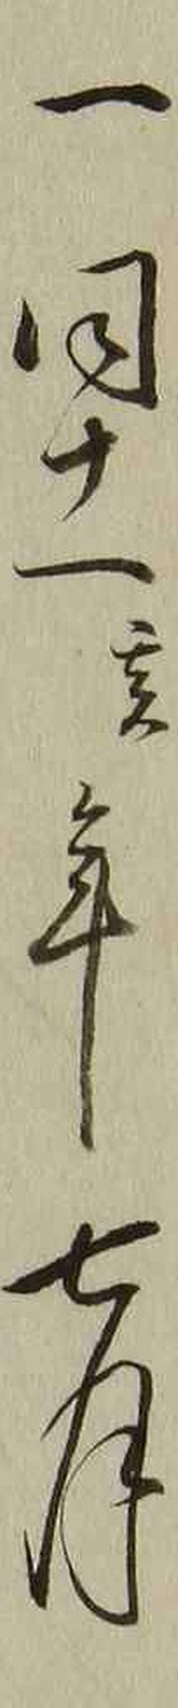一同十一亥年七月
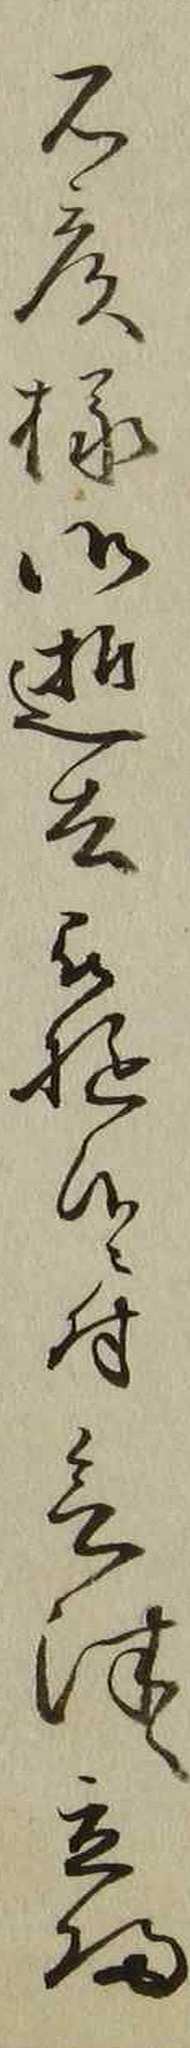石彦様御逝去被遊候ニ付会津へ立帰
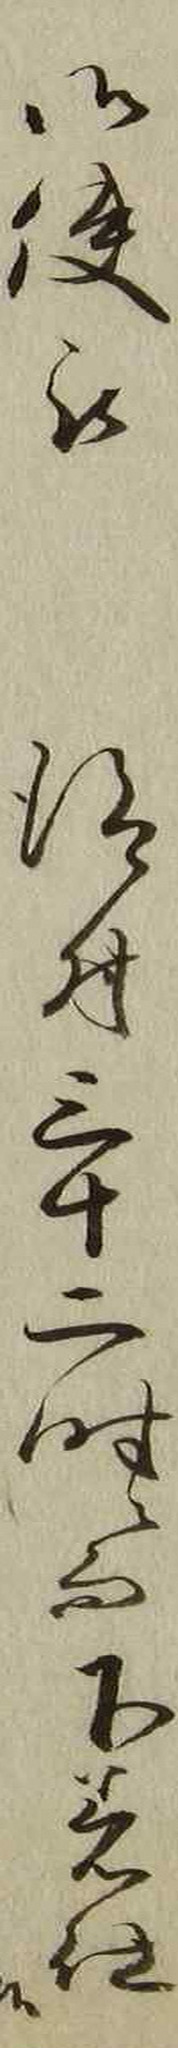御使被仰付三十二時ニ而下着仕候
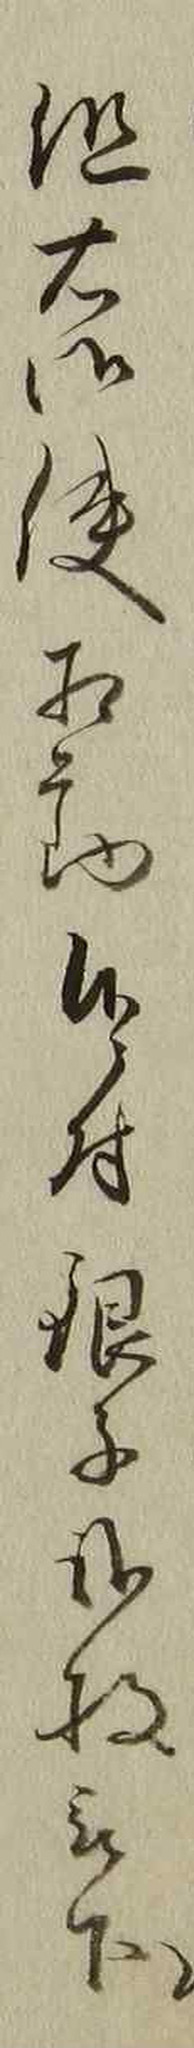但右御使相勤候ニ付銀子弐枚被下
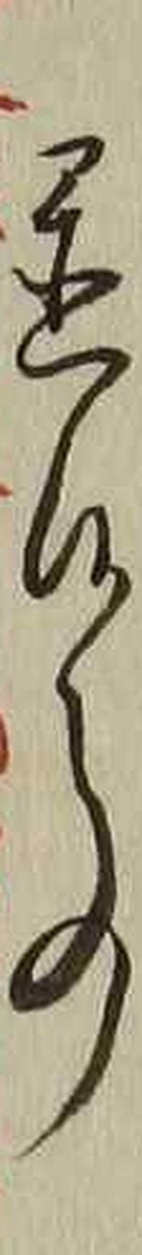置候事
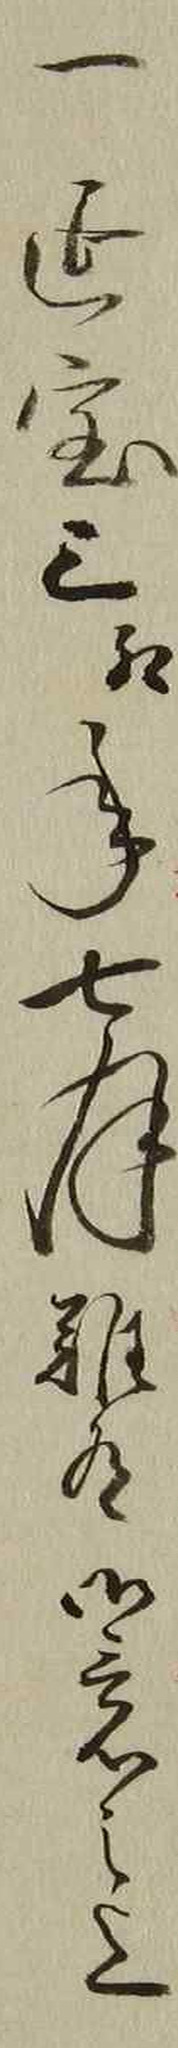一延宝三卯年七月難有御意之上
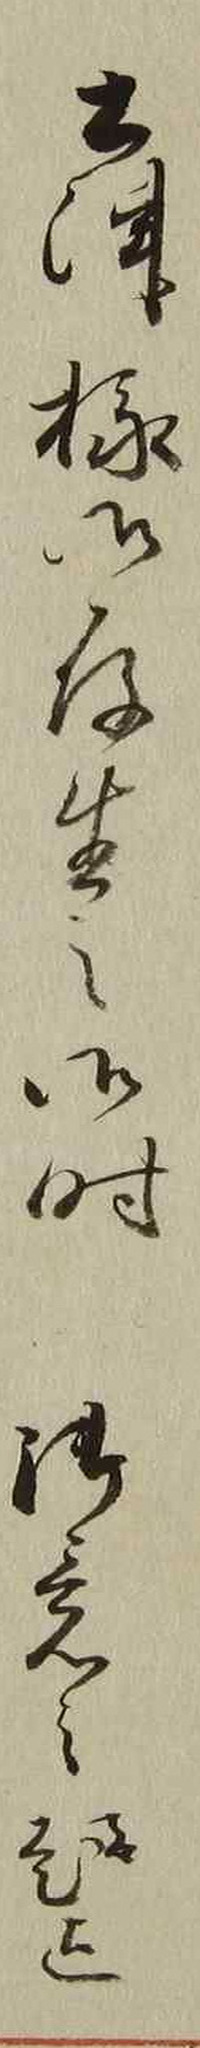土津様御存生之御時御意之趣迄
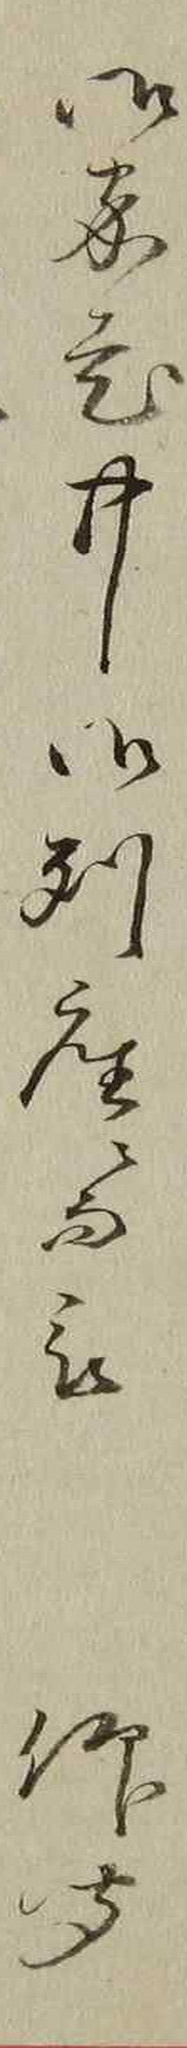御家老中御列座ニ而被仰聞
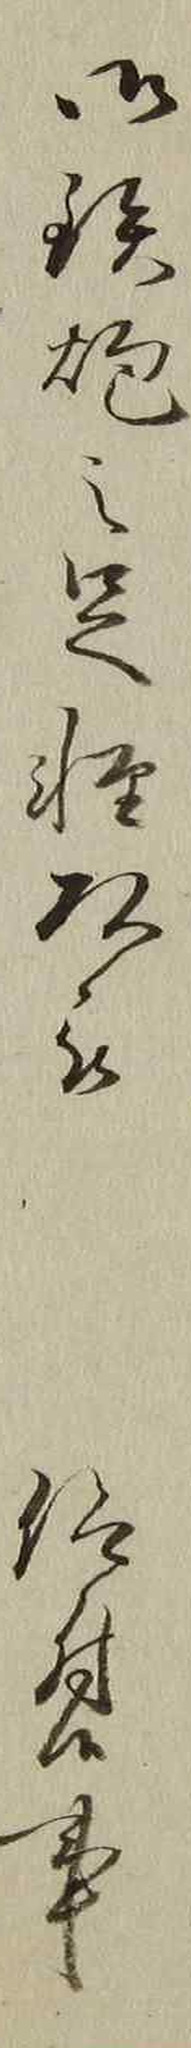御鉄炮之足軽頭被仰付候事
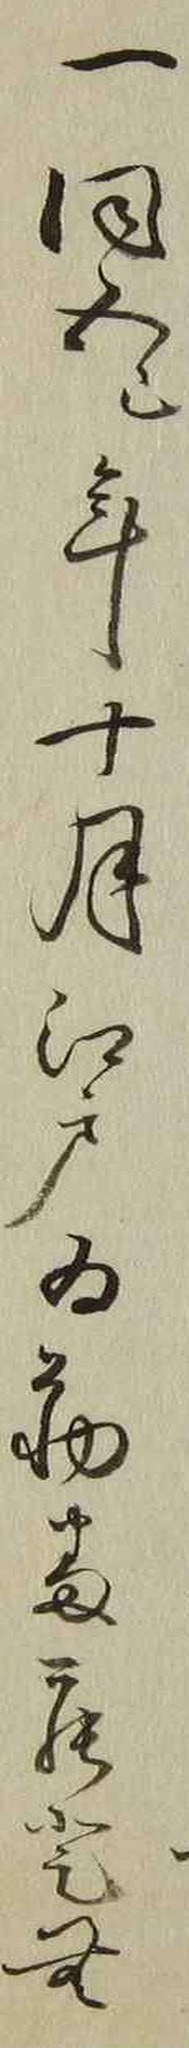一同五巳年十月江戸為勤番罷登無
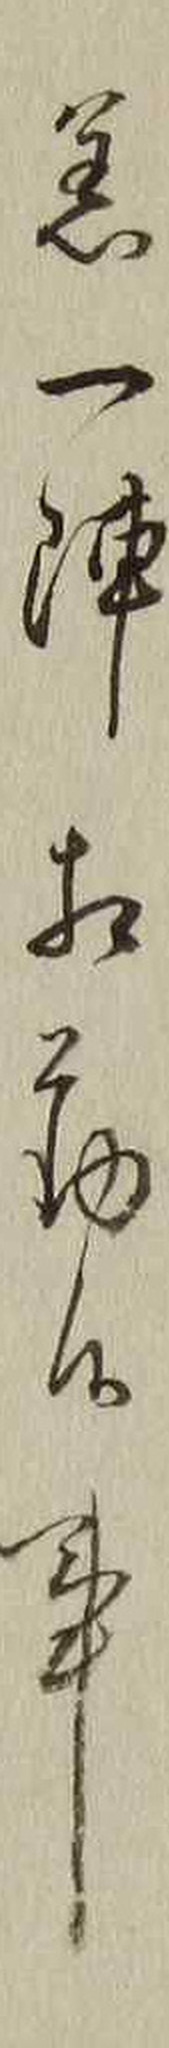恙一陣相勤候事
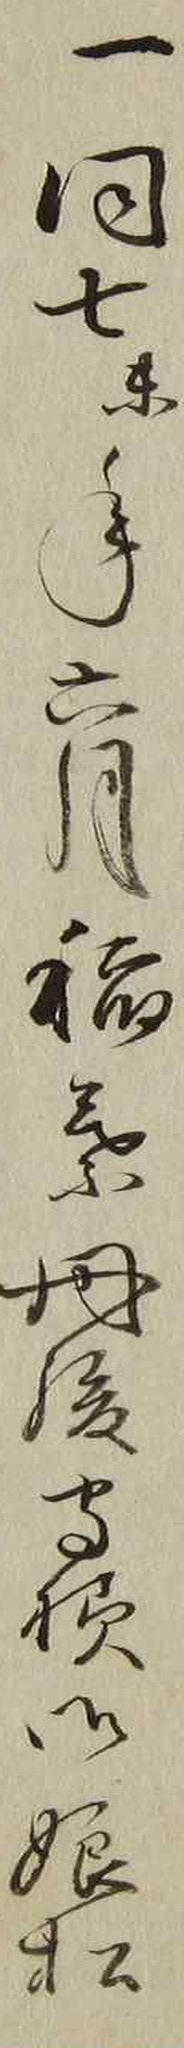一同七未年六月稲葉丹後守様御娘松
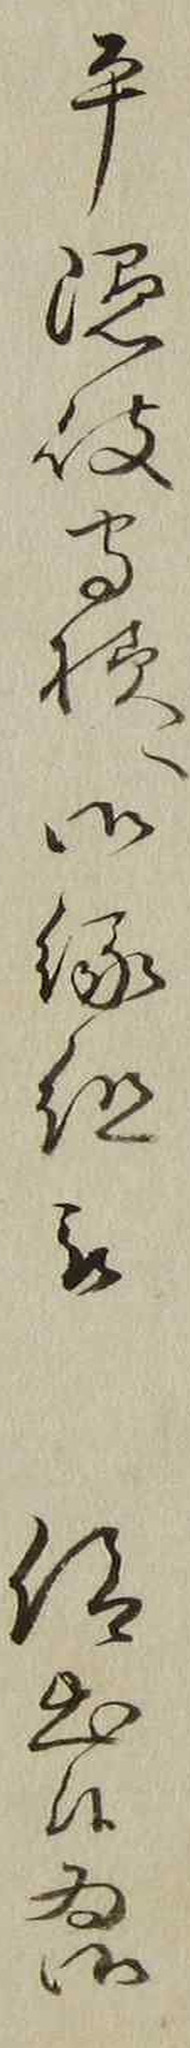平隠岐守様へ御縁組被仰出候為御
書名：諸士系譜　巻之2　い之部2
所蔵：会津若松市立会津図書館
